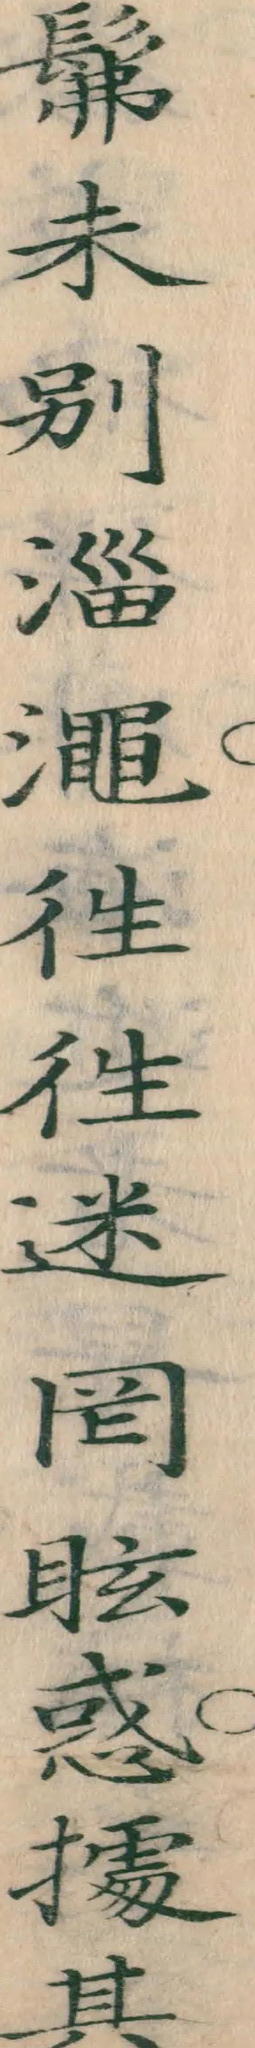髴未別淄澠。往往迷罔眩惑。拠其

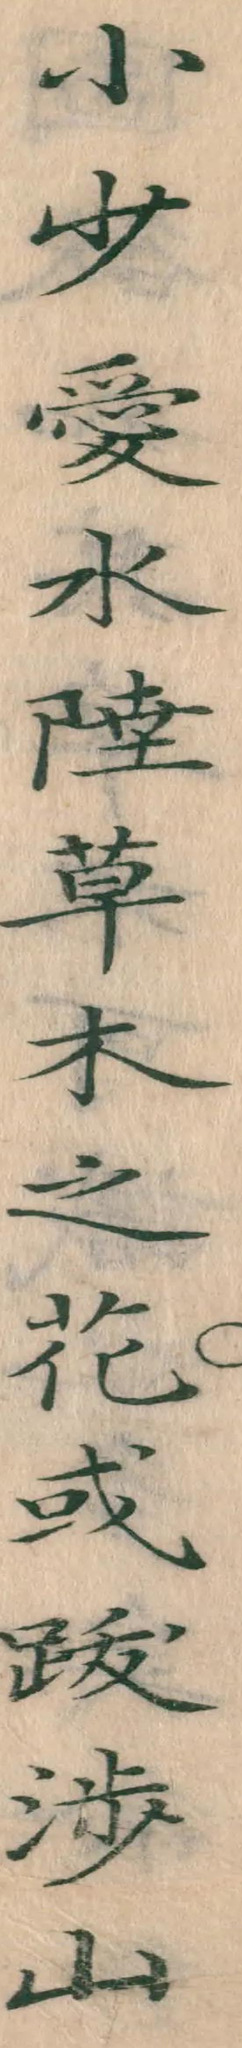小少愛水陸草木之花。或跋渉山
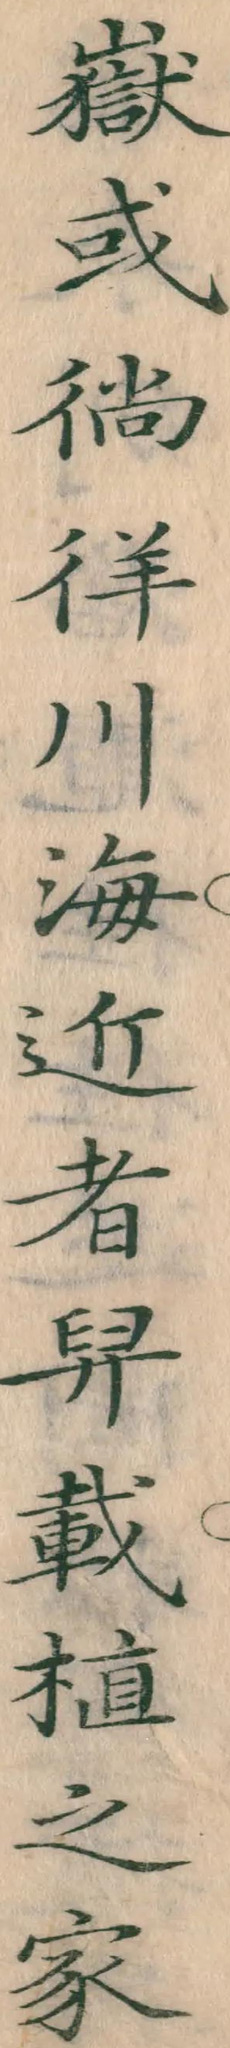岳。或徜徉川海。近者舁載。植之家
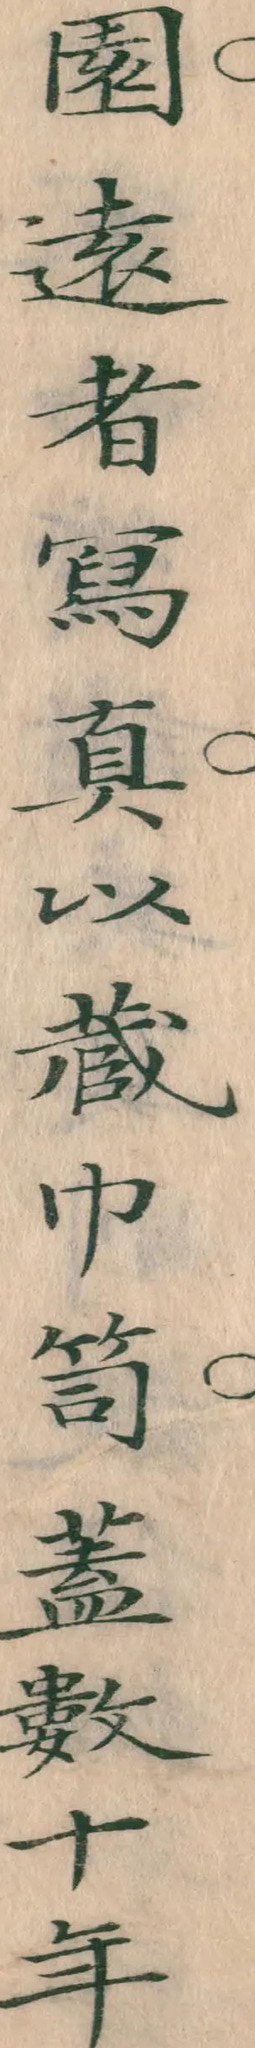園。遠者写真。以蔵巾笥。蓋数十年
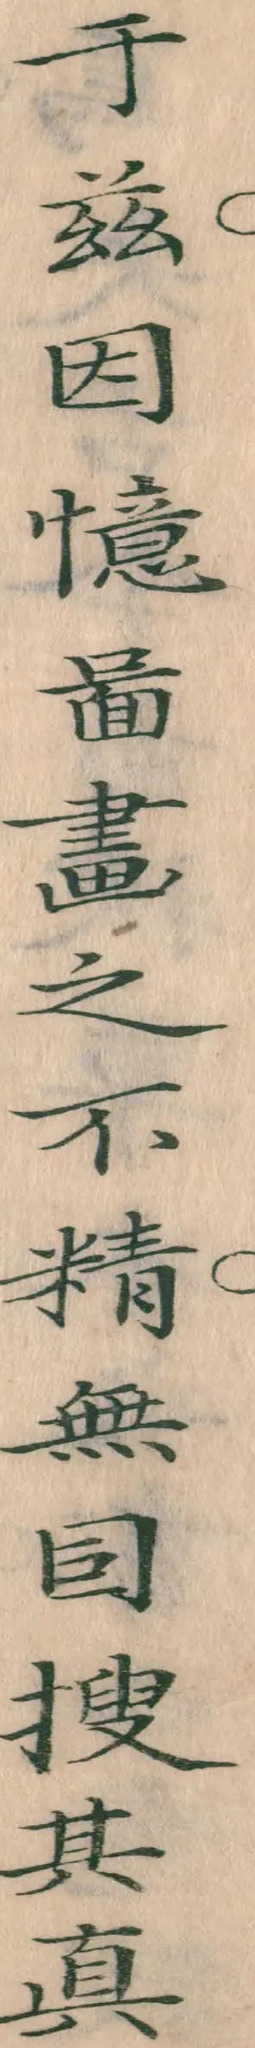于茲。因憶図画之不精。無◼捜其真
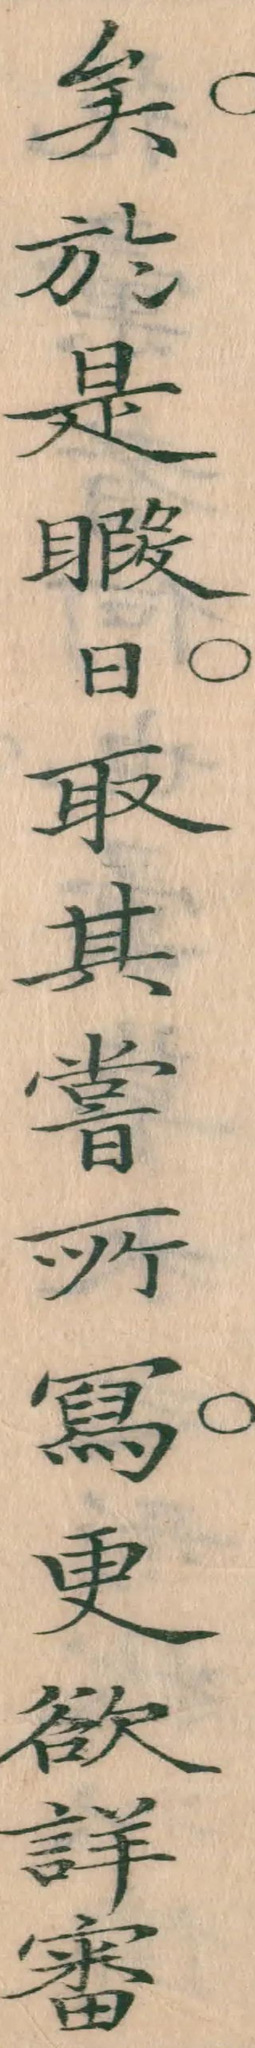矣。於是暇日。取其嘗所写。更欲詳審
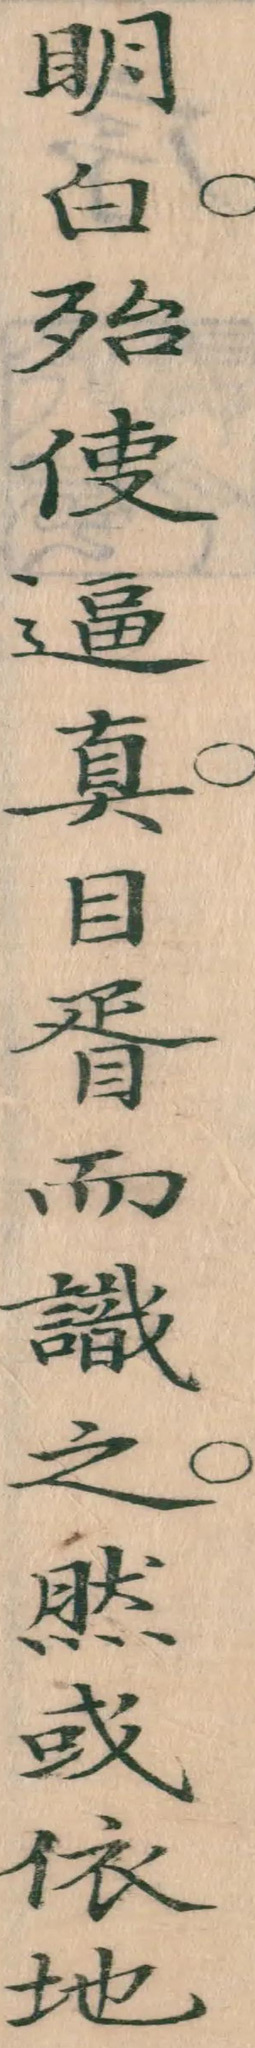明白。殆使逼真。目胥而識之。然或依地
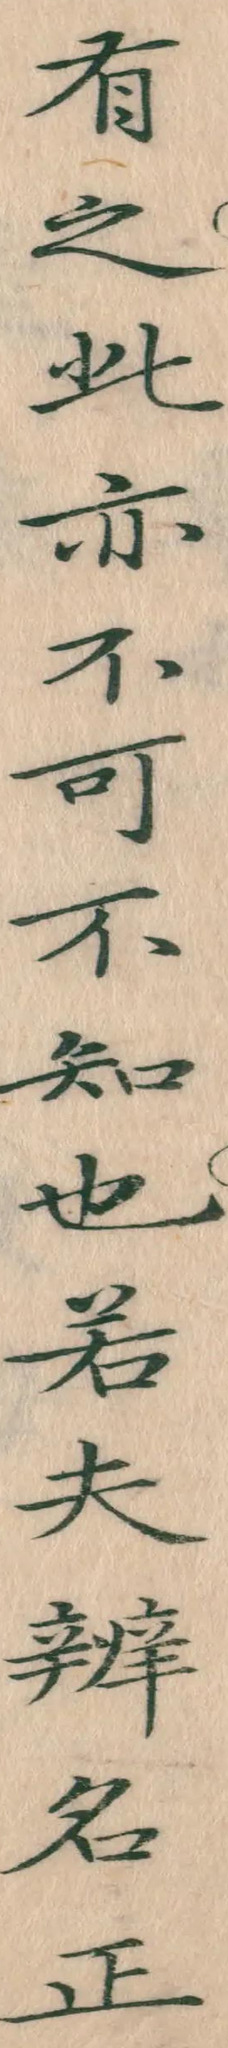有之。此亦不可不知也。若夫弁名正
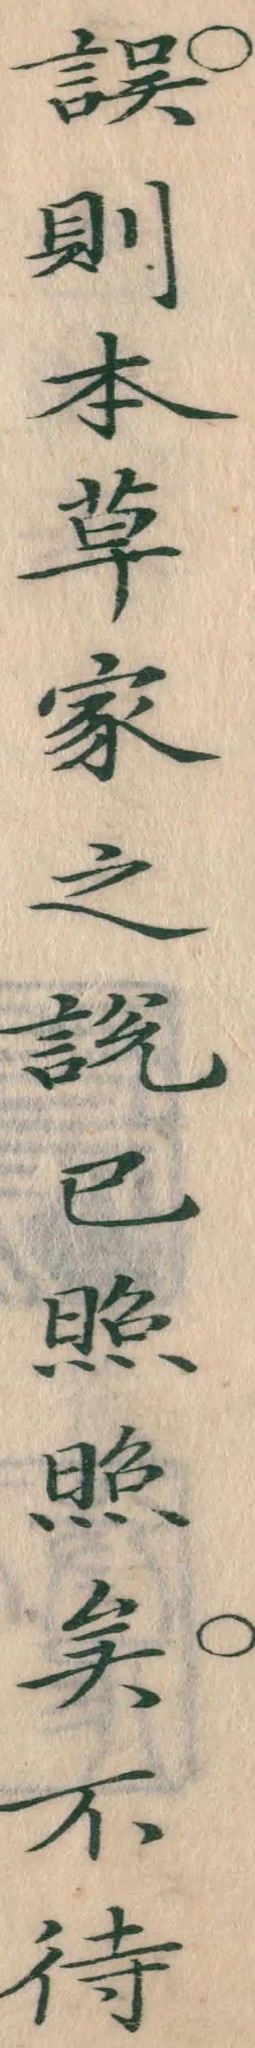誤。則本草家之説已照照矣。不待
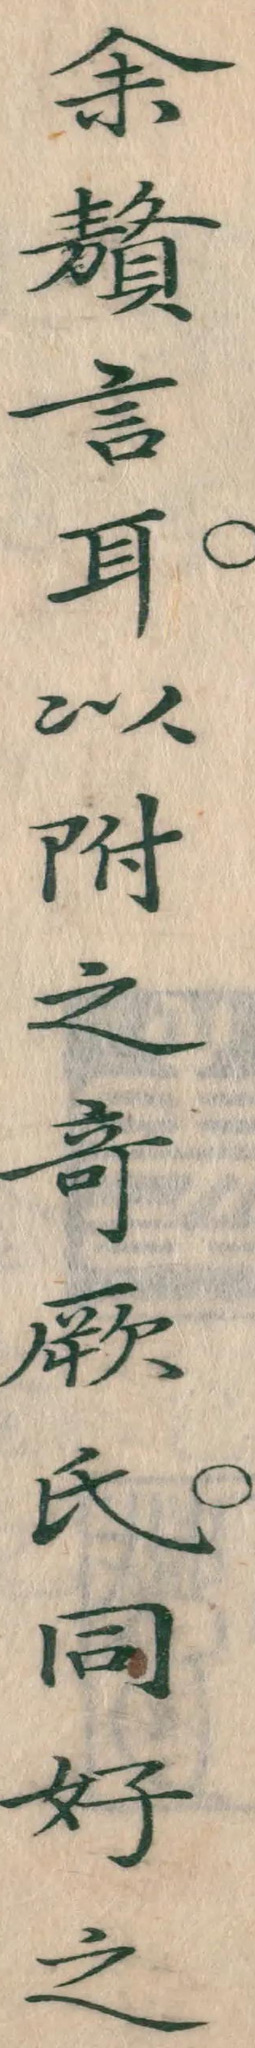余贅言耳。以附之奇厥氏。同好之
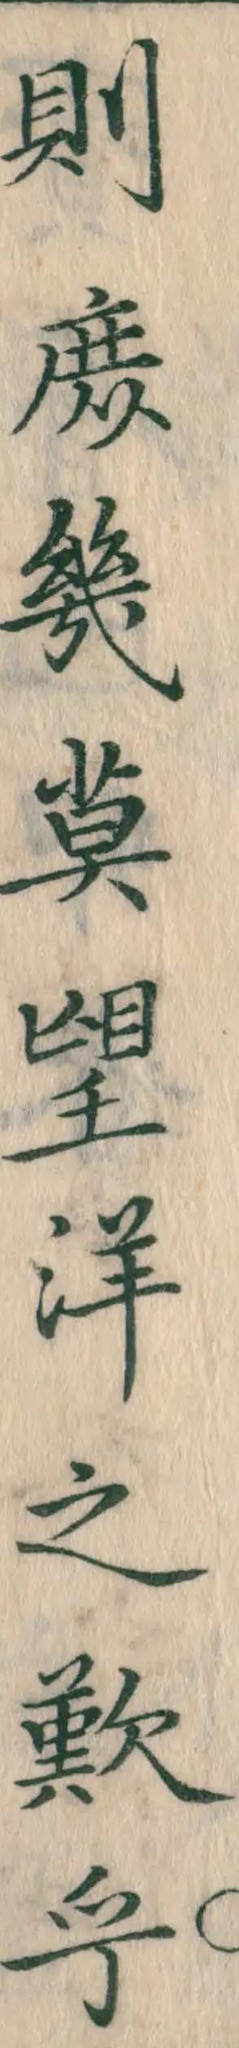則庶幾莫望洋之歎乎。

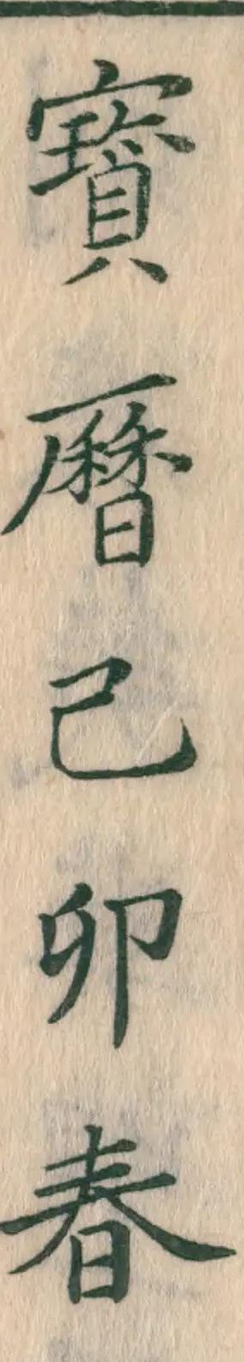宝暦己卯春
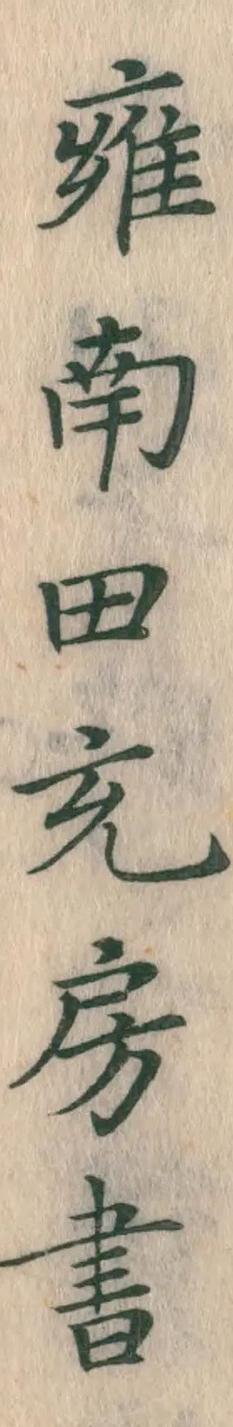雍南田充房書
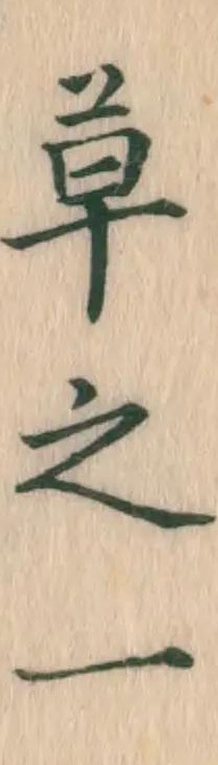草之一

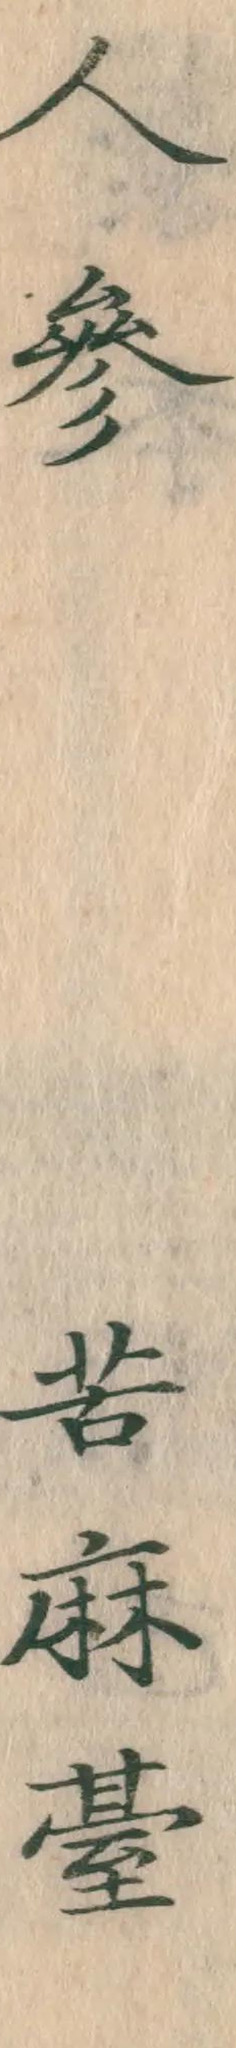人参苦麻台

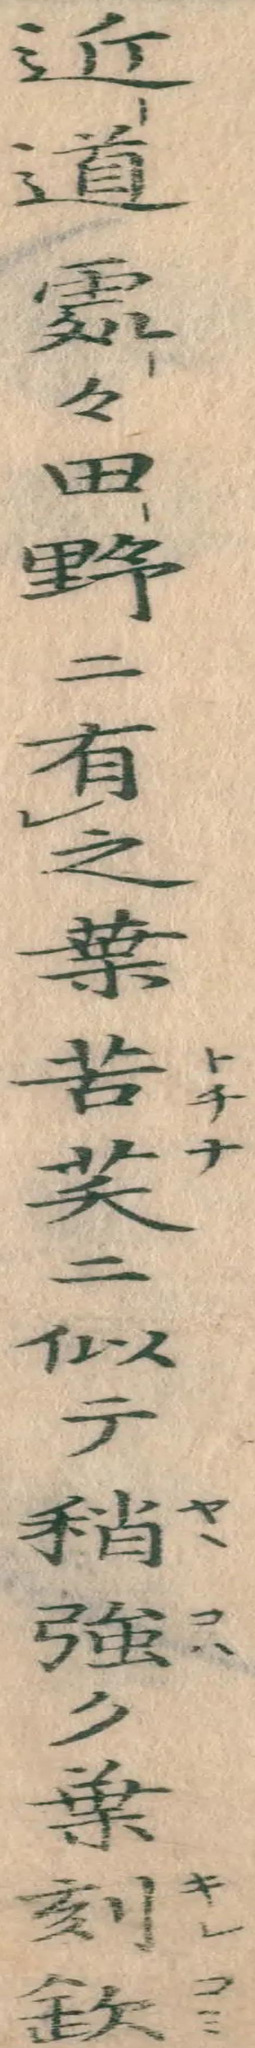近-道処-々田-野ニ有之葉苦芺ニ似テ稍強ク葉刻欽
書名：花彙 草部4巻木部4巻. [1]
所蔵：国立国会図書館 National Diet Library, JAPAN
